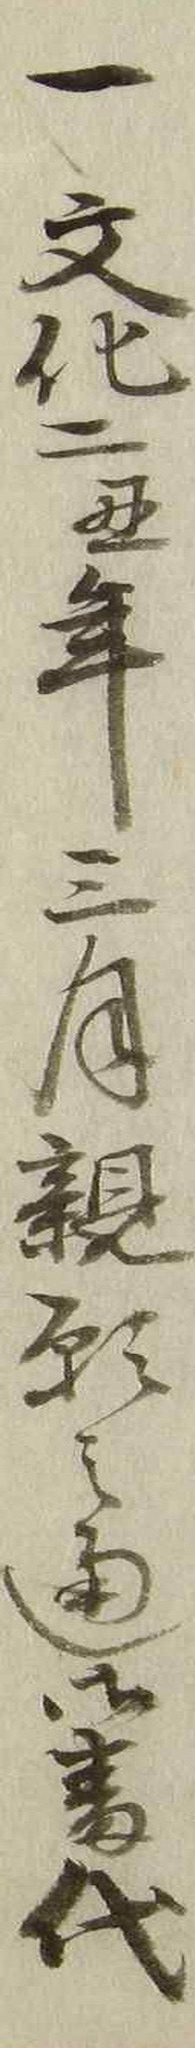一文化二丑年三月親願之通御番代
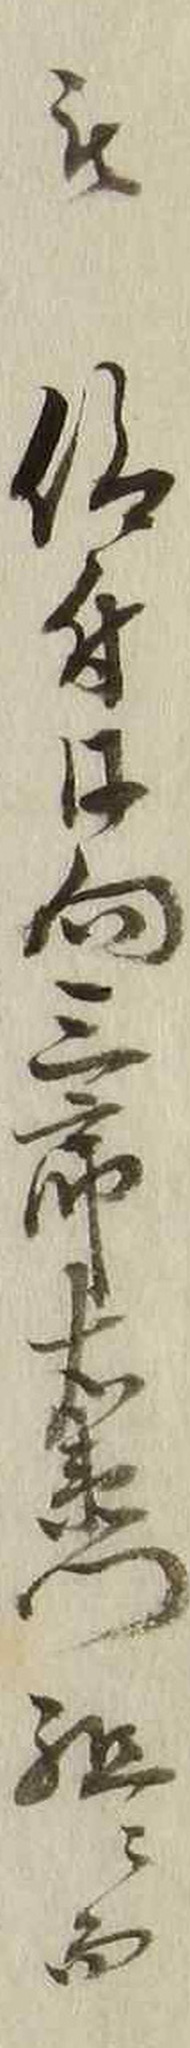被仰付日向三郎右衛門組ニ而
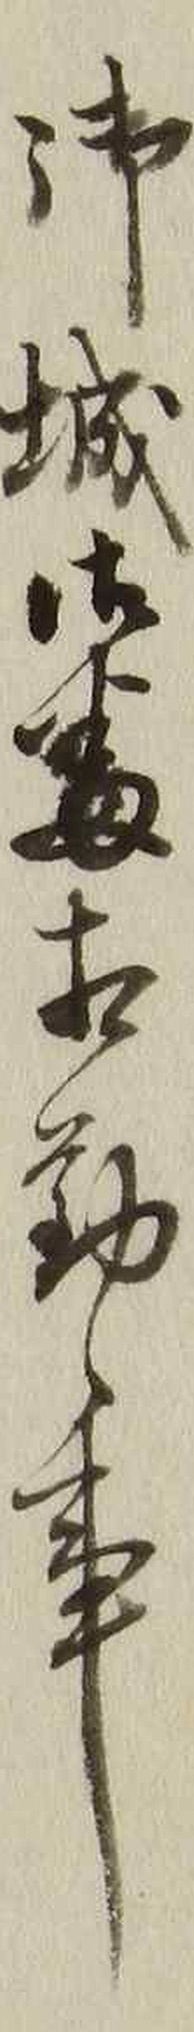御城御番相勤候事
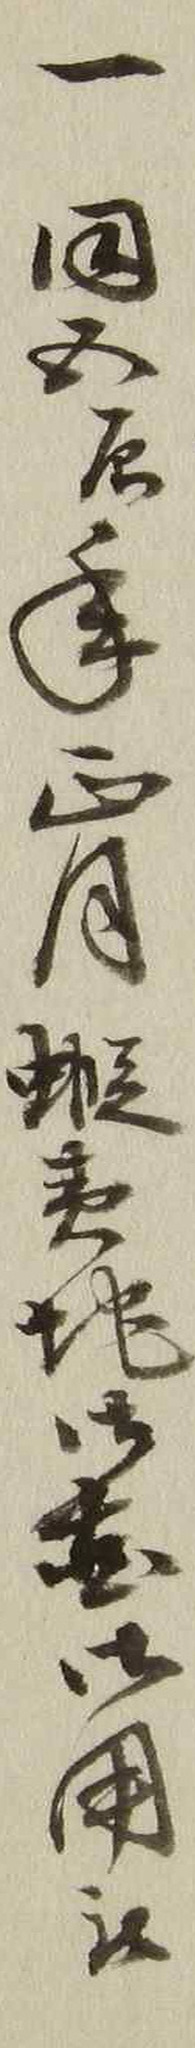一同五辰年正月蝦夷地御固御用被
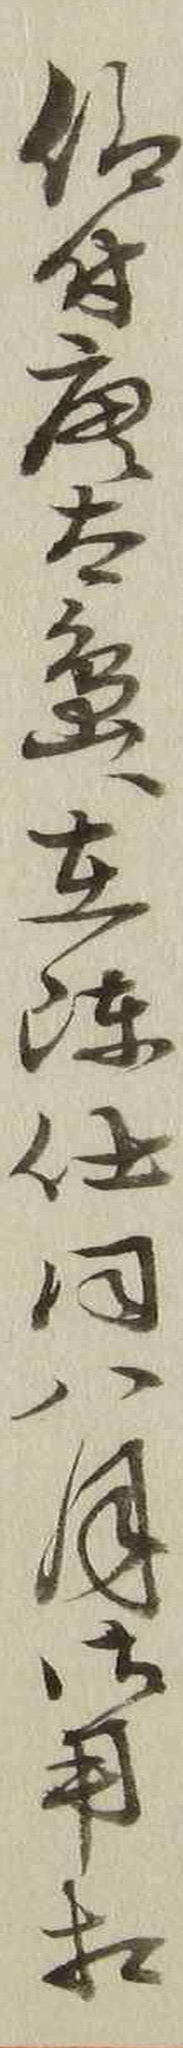仰付唐太島へ在陣仕同八月御用相
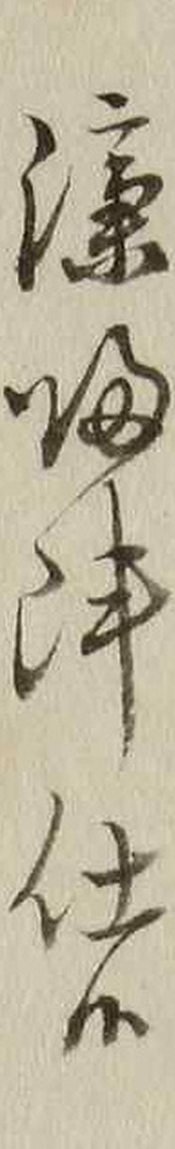済帰陣仕候
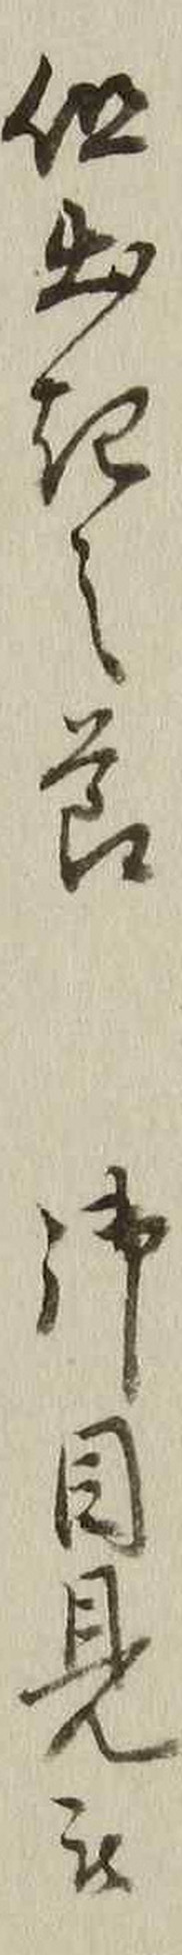但出起之節御目見被
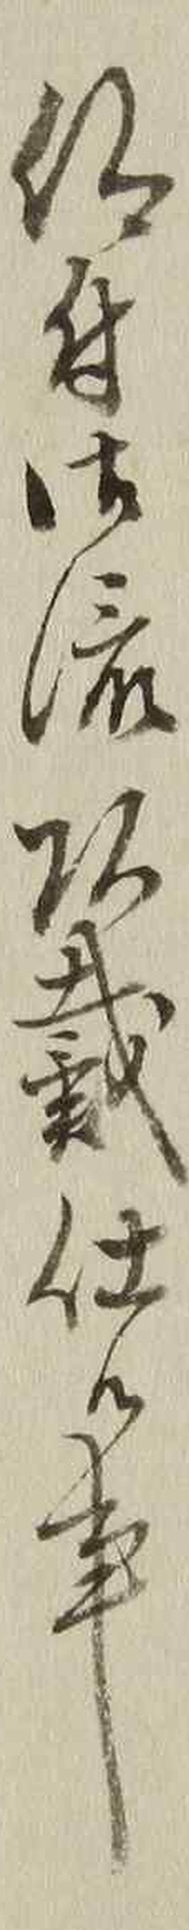仰付御流頂頂戴仕候事
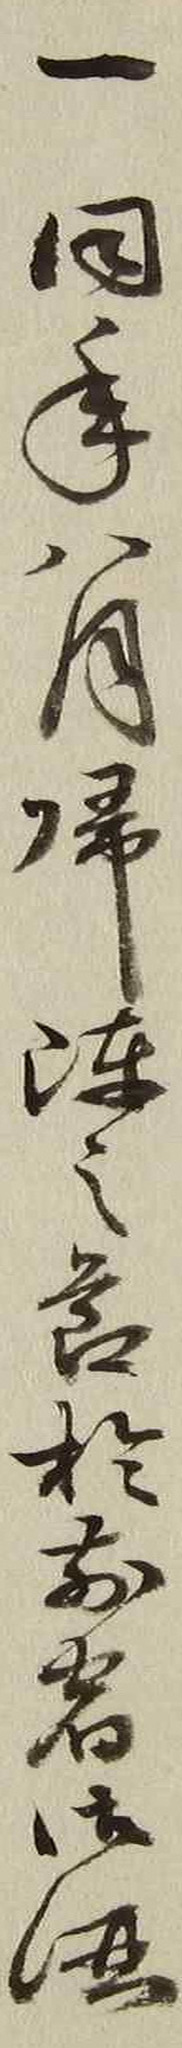一同年八月帰陣之節於前宿御酒
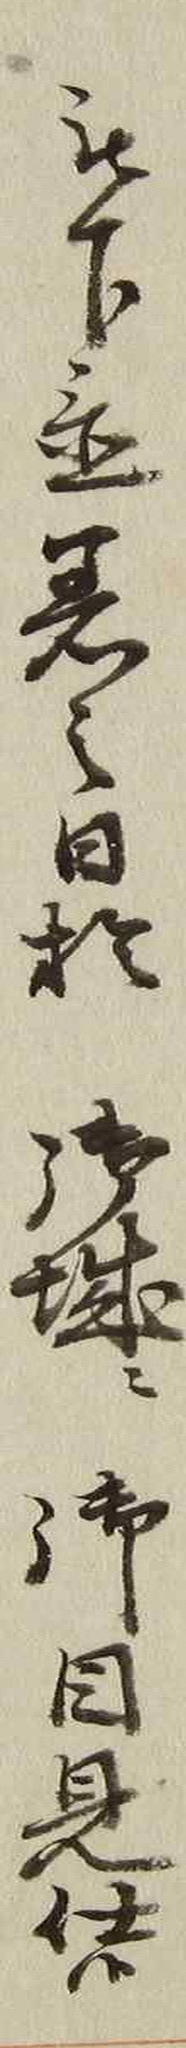被下置着之日於御城ニ御目見仕候
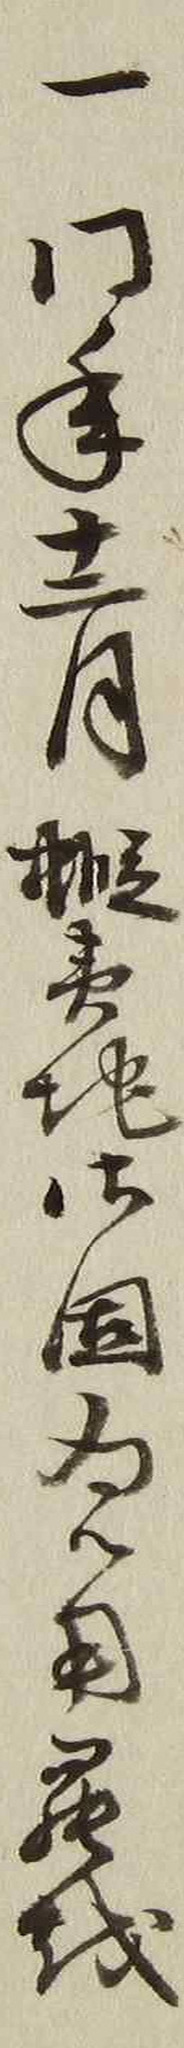一同年三月蝦夷地御固為御用罷越
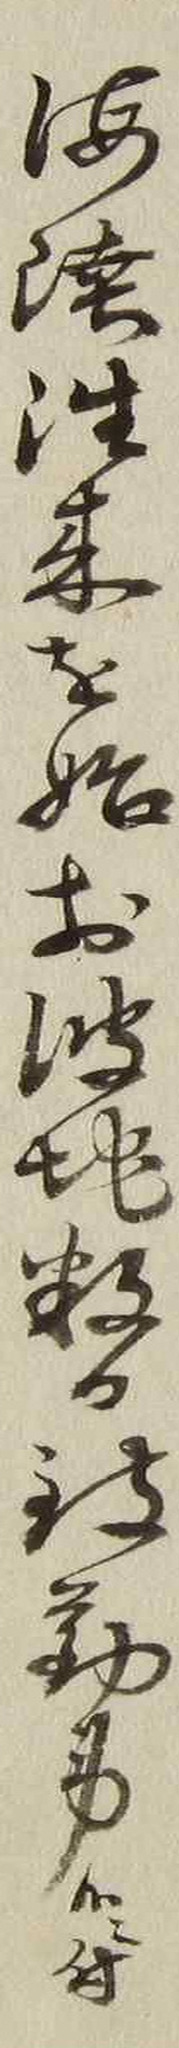海陸往来を始於彼地数日致勤労候ニ付
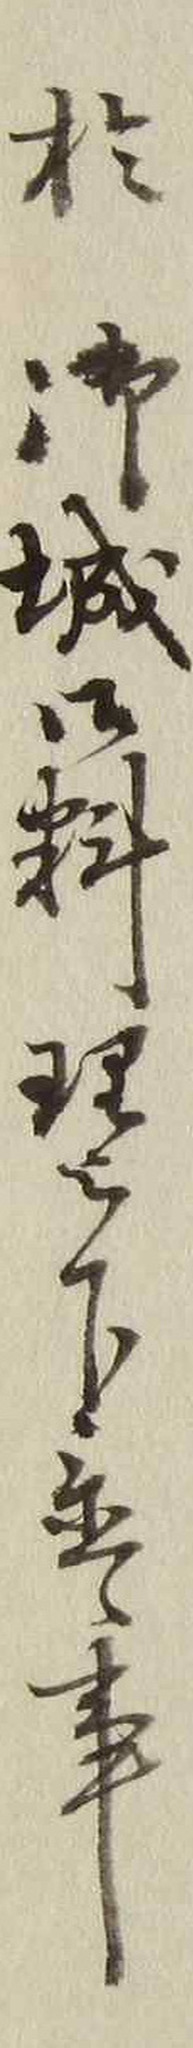於御城御料理被下置候事
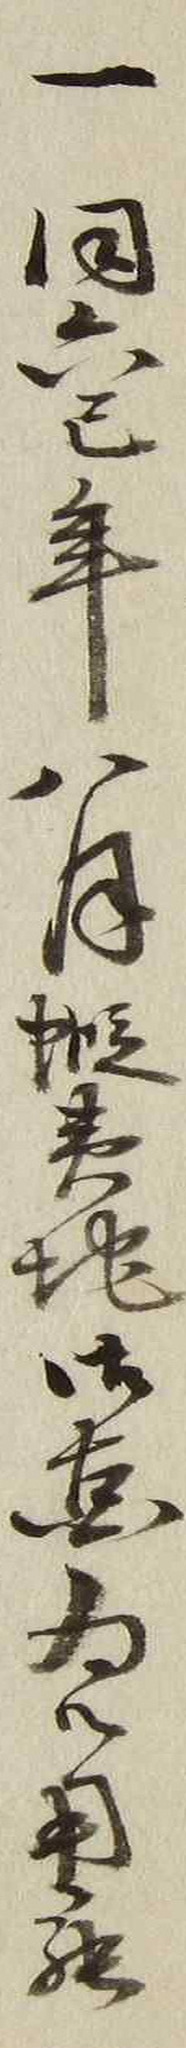一同六巳年八月蝦夷地御固為御用罷
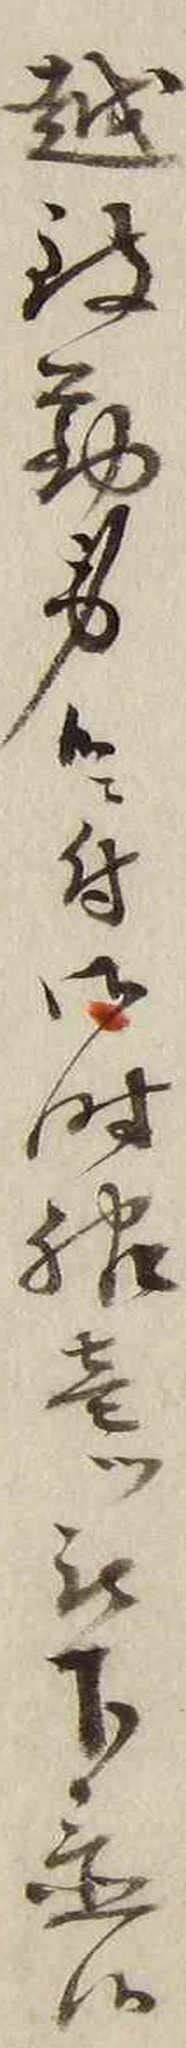越致勤労候ニ付御時服壱ツ被下置候
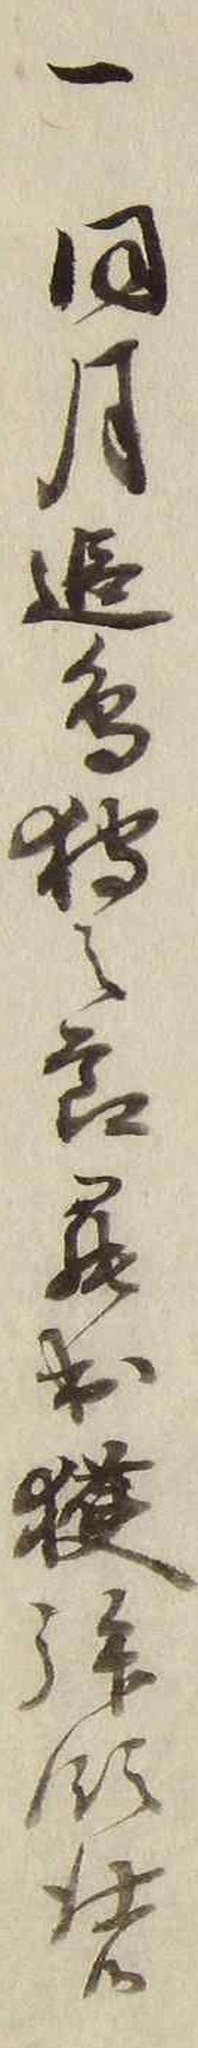一同月追鳥狩之節罷出獲拝領仕候
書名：諸士系譜　巻之27　い之部27
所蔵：会津若松市立会津図書館
